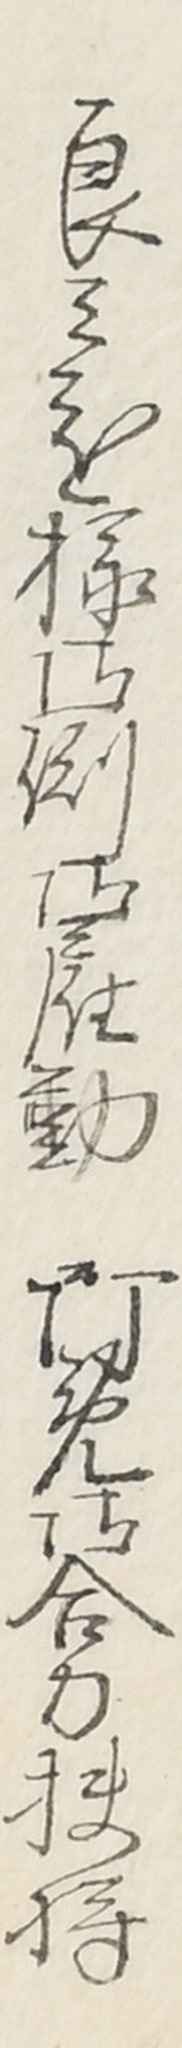良之進様御側御雇勤御免御合力扶持
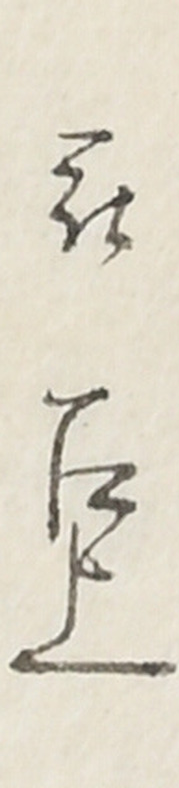被召上
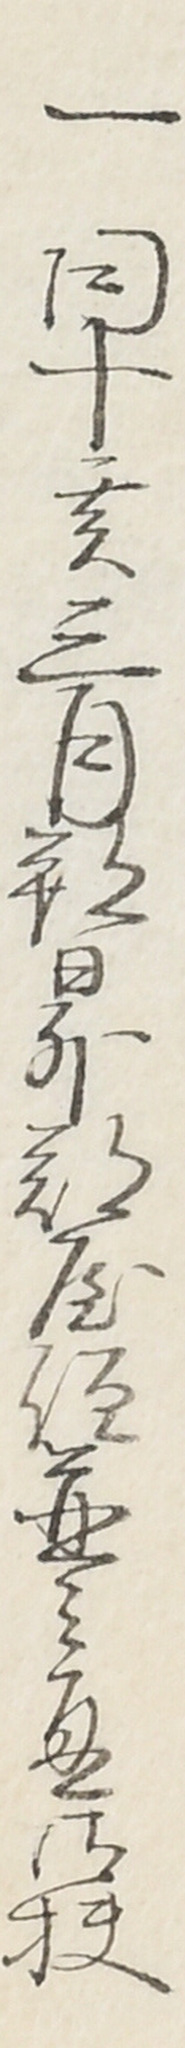一同十亥三月朔日外部屋住並之通御扶
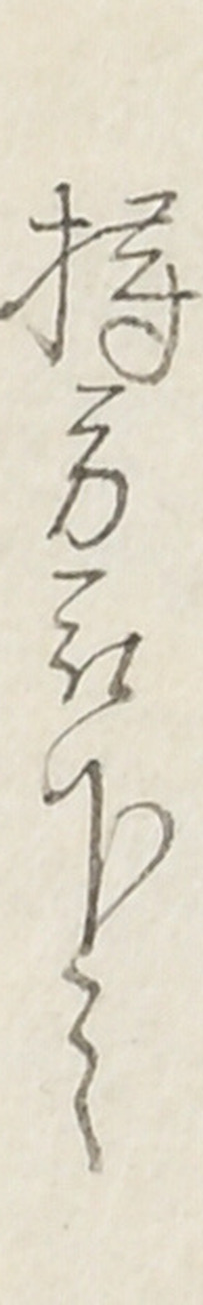持方被下之
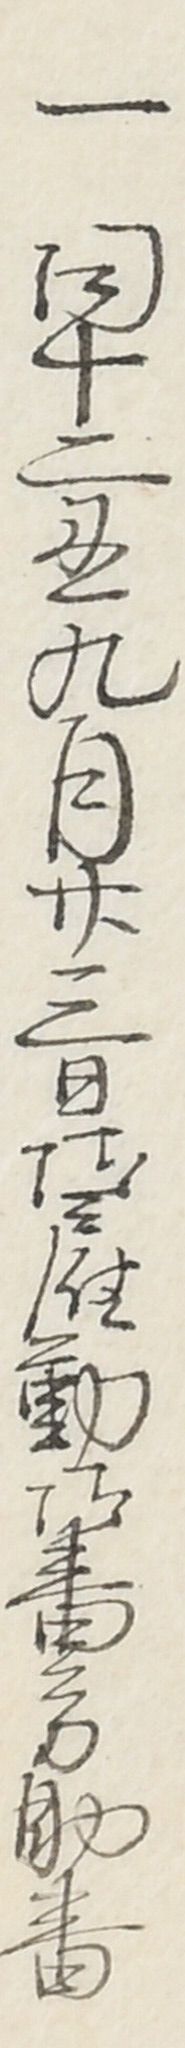一同十二丑九月廿三日御雇勤御番方助番
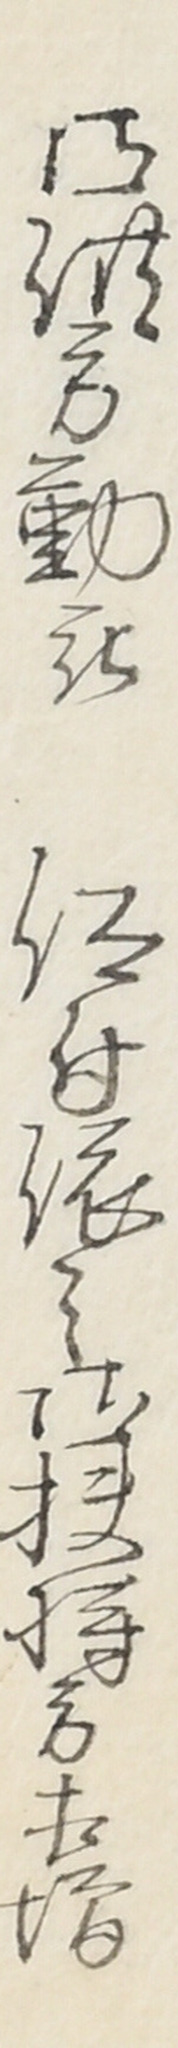御供方勤被仰付依之御扶持方相増
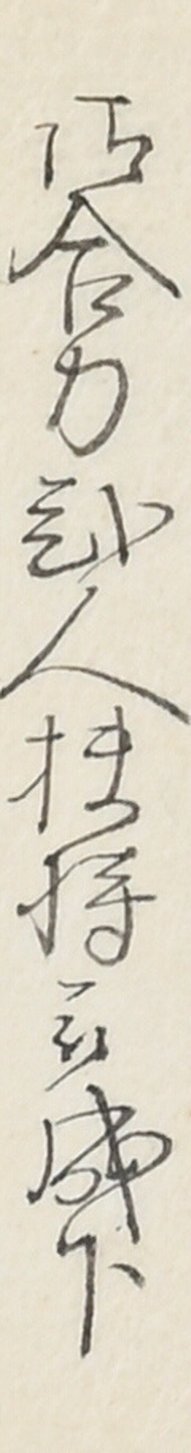御合力弐人扶持被成下
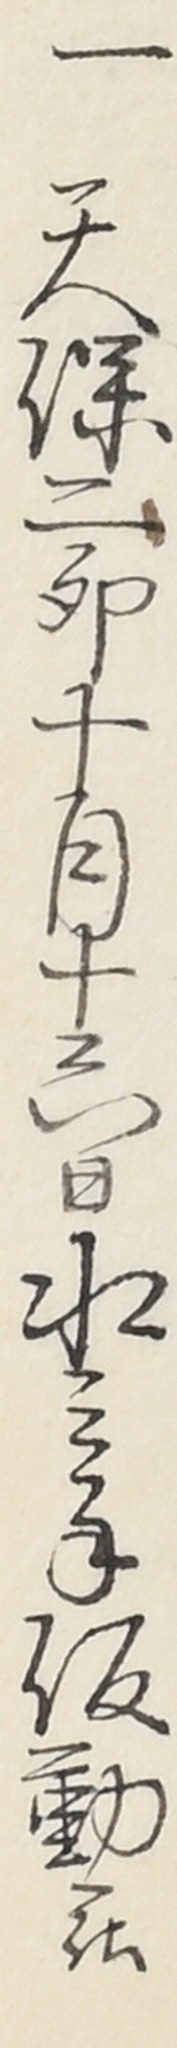一天保二卯十月十六日水之手仮勤被

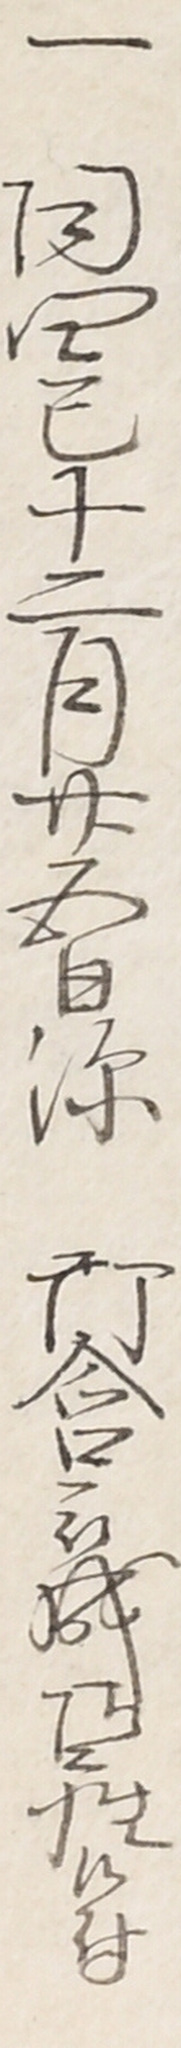一同四巳十二月廿五日深御含被成御雇候付
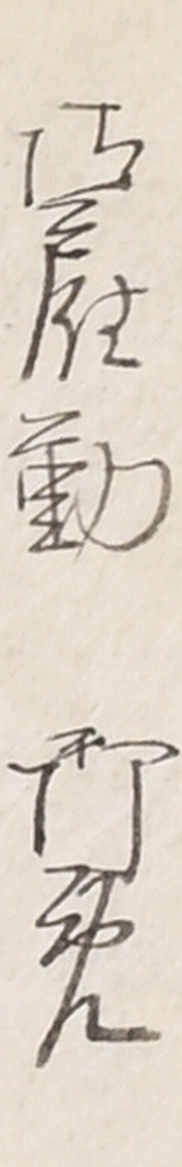御雇勤御免
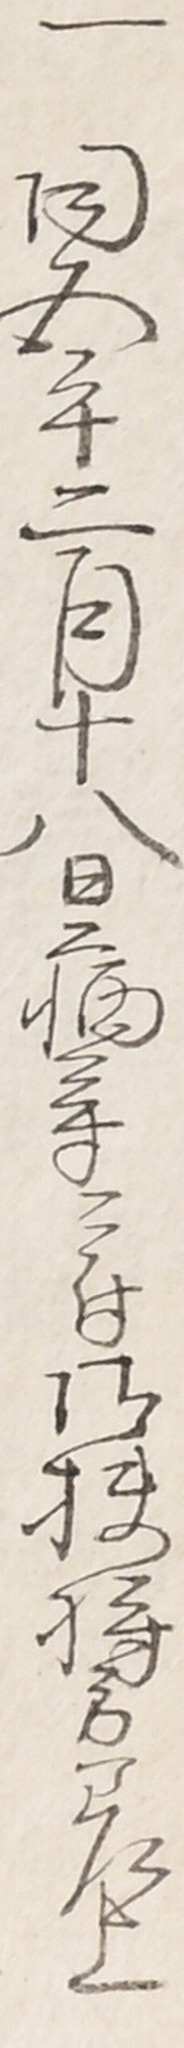一同五午二月十八日病気ニ付御扶持方差上
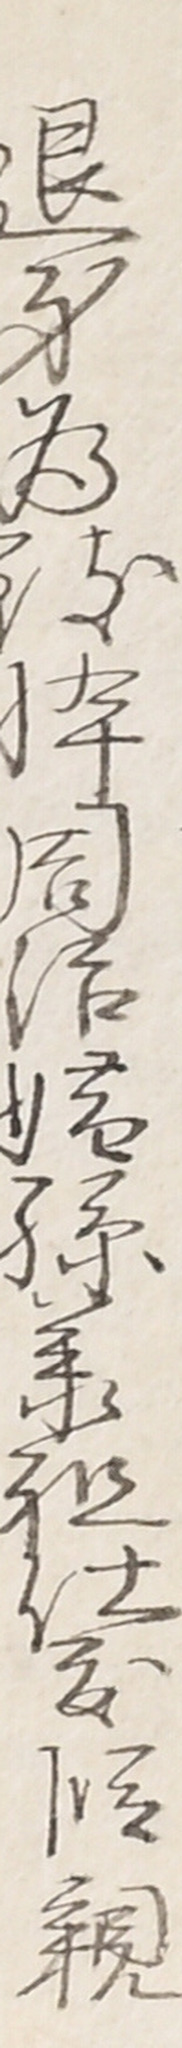退身為致伜周治嫡孫承祖仕度段親
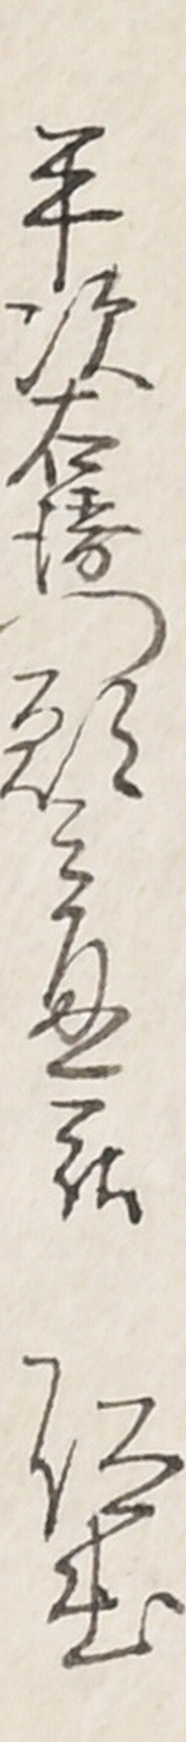平次右衛門願之通被仰出
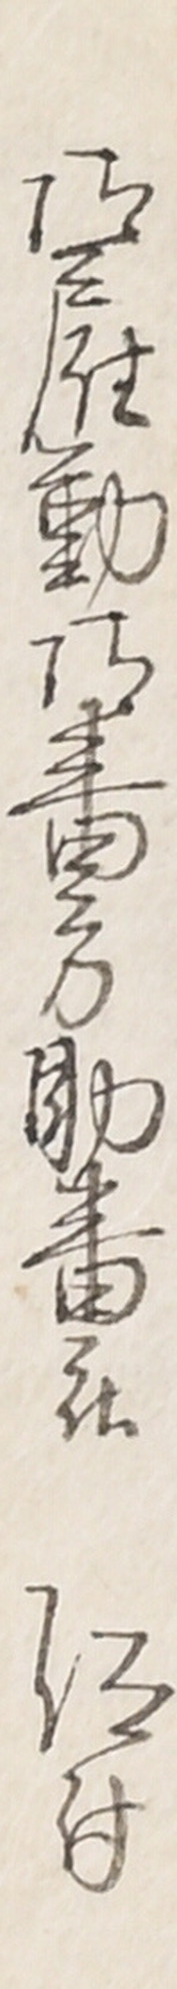御雇勤御番方助番被仰付
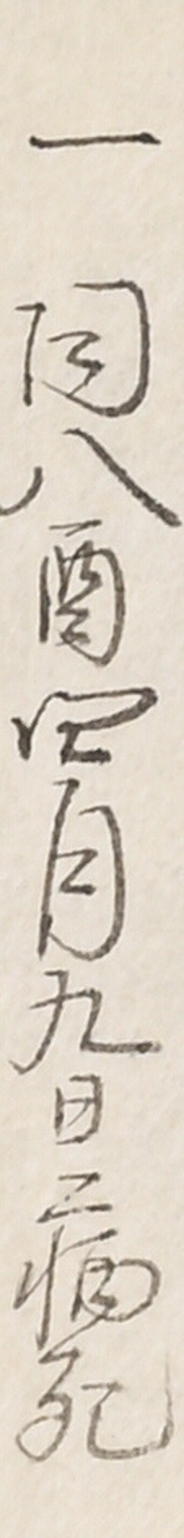一同八酉四月九日病死
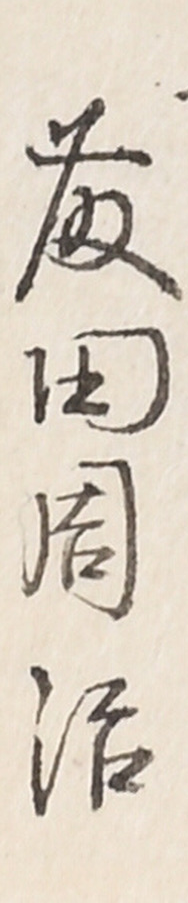藤田周治
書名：給人諸士勤仕録（七）
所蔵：伊那市立高遠町図書館・合同会社AMANE
